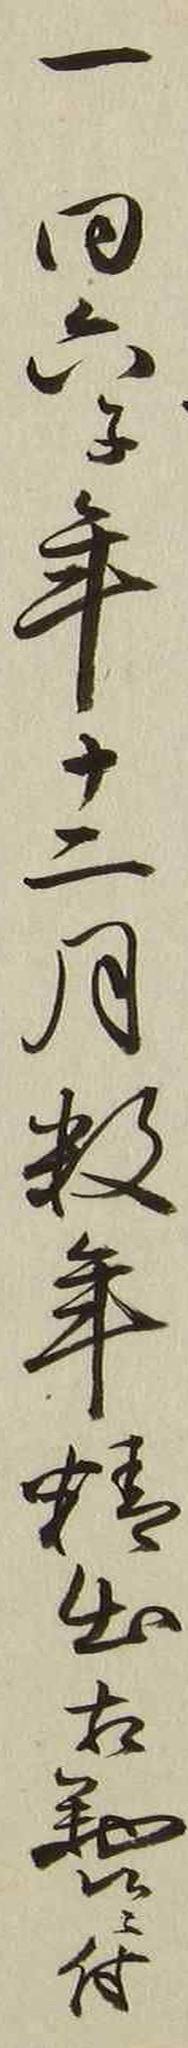一同六子年十二月数年精出右勤候ニ付
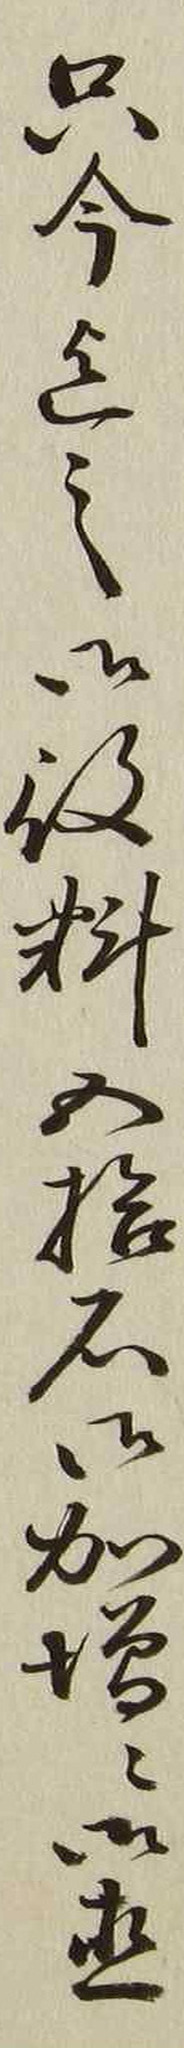只今迄之御役料五拾石御加増ニ御直
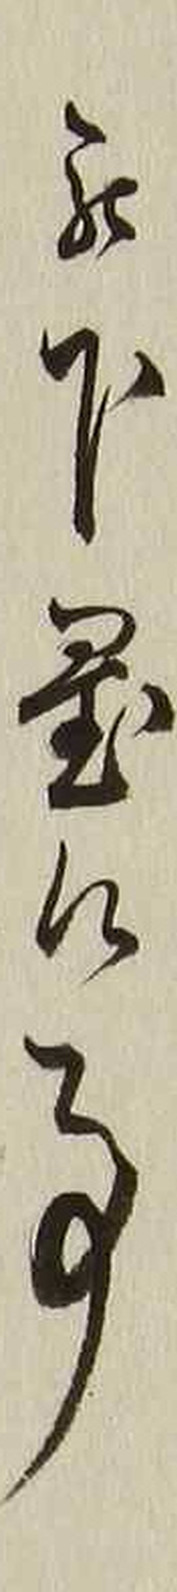被下置候事
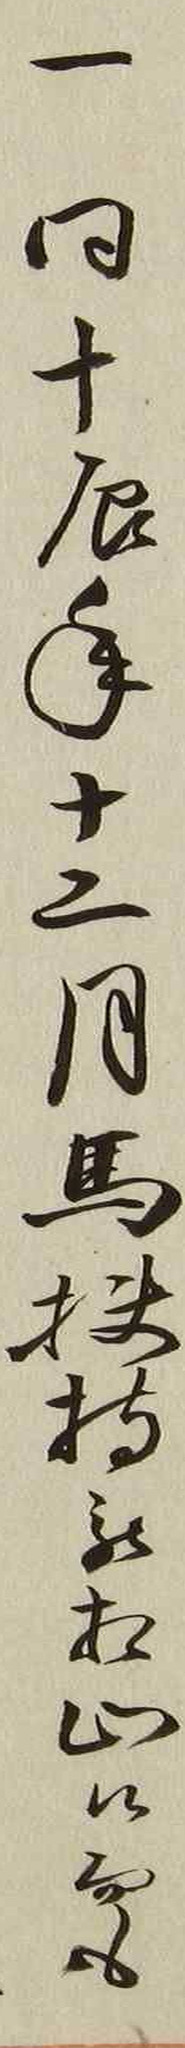一同十辰年十二月馬扶持被相止候而も
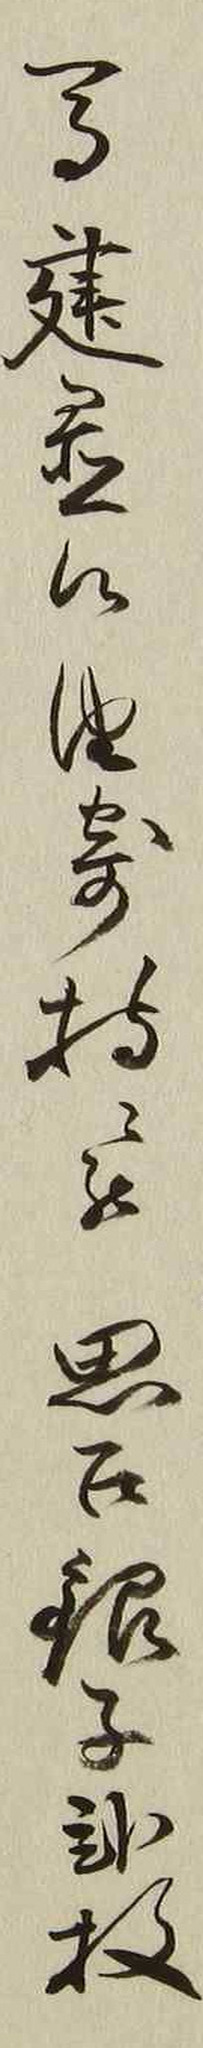馬建置候由寄特ニ被思召銀子弐枚
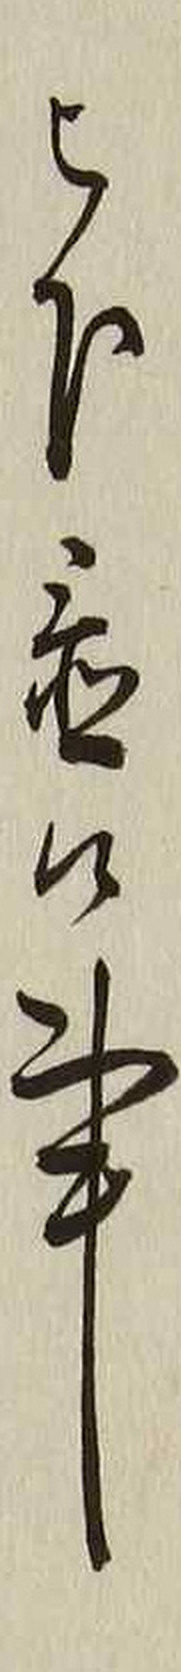被下置候事
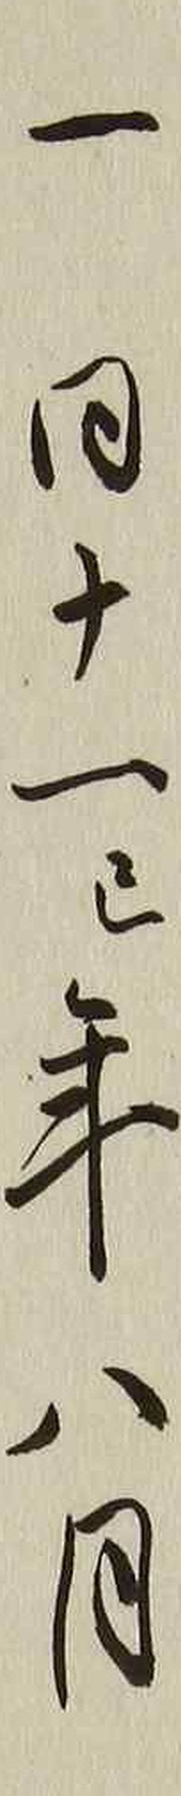一同十一巳年八月
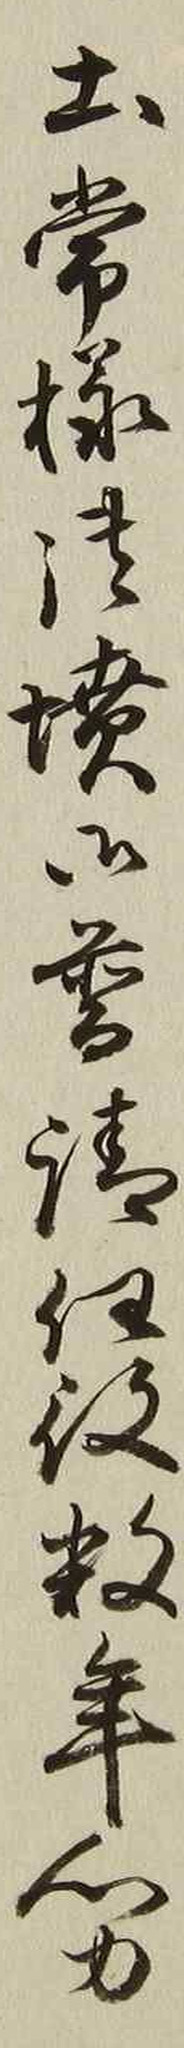土常様御墳御普請任役数年心力
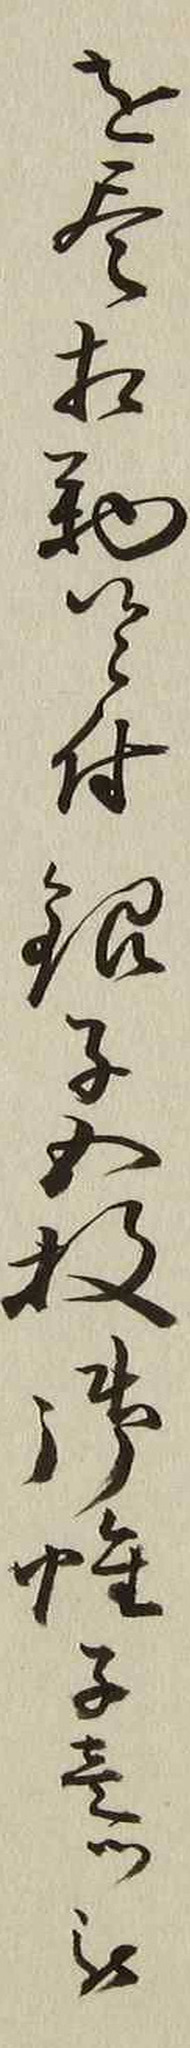を尽相勤候ニ付銀子五枚御帷子壱ツ被
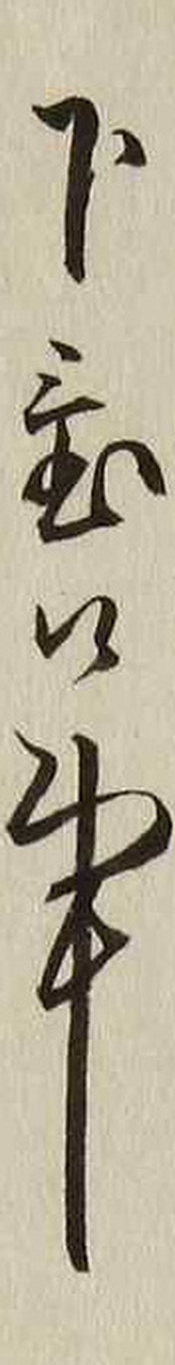下置候事
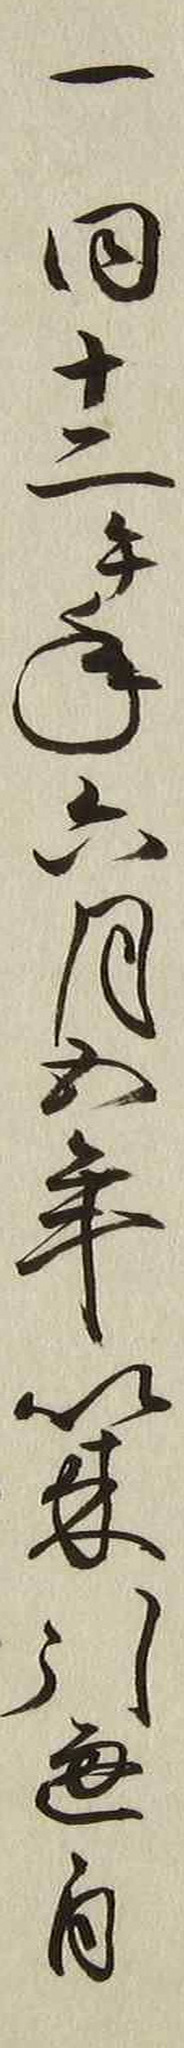一同十二午年六月五年以来引通自
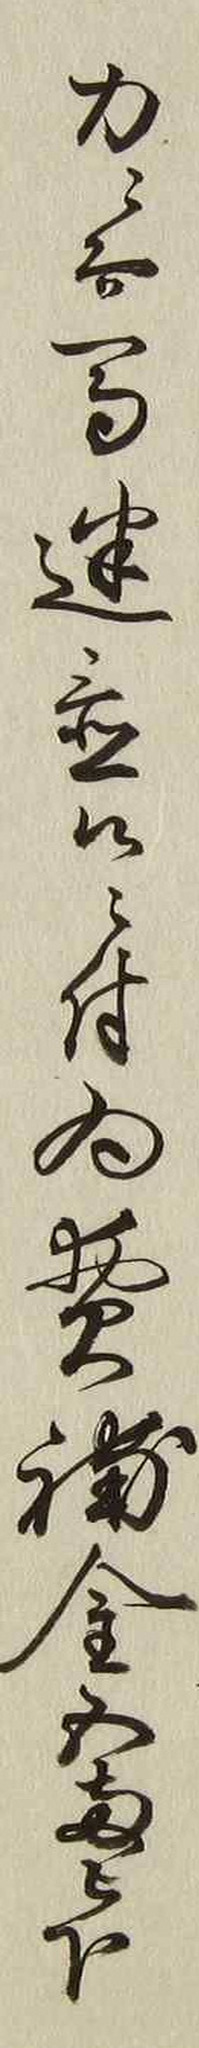力ニ而馬建置侯ニ付為費補金五両被下
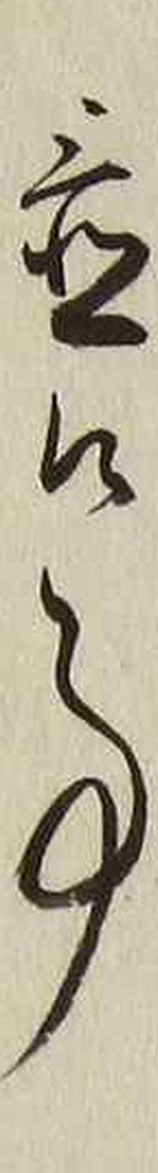置候事
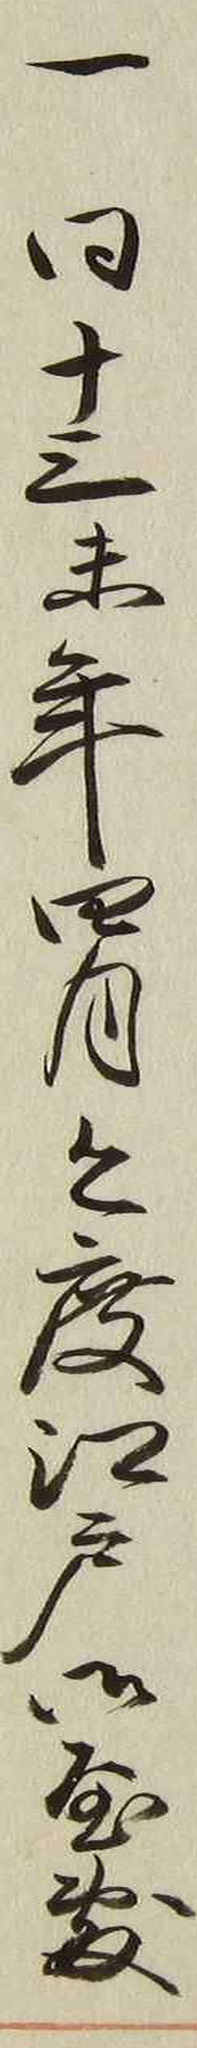一同十三未年四月今度江戸御屋敷
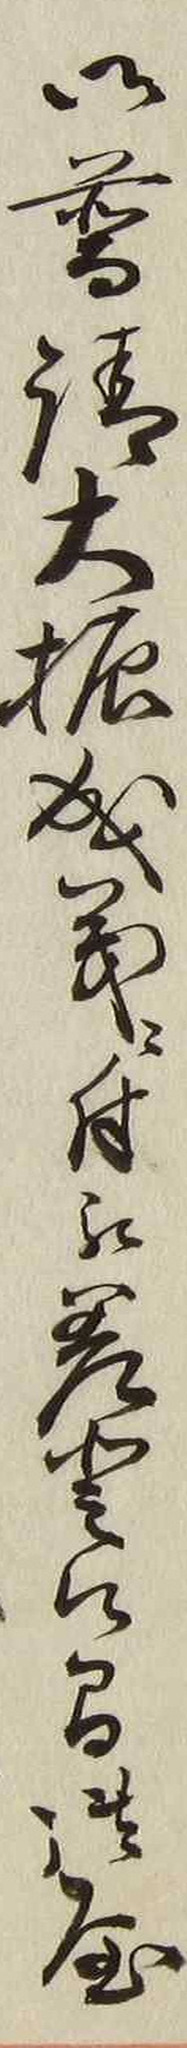御普請大振成義ニ付被差登候間御屋
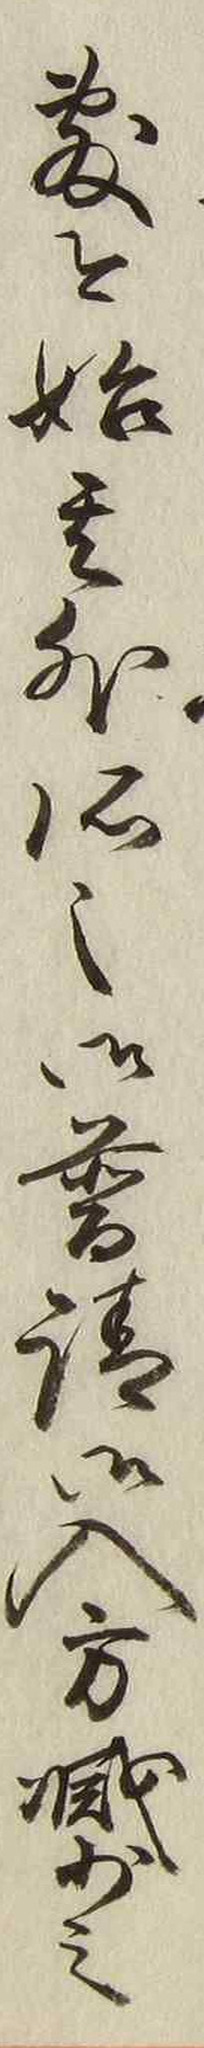敷を始其外所之御普請御入方減少之
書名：諸士系譜　巻之21　い之部21
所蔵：会津若松市立会津図書館
